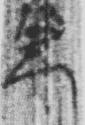也
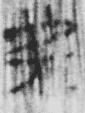弗
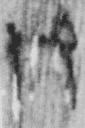{木父}（輔）
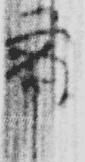不
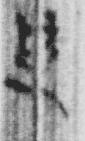足
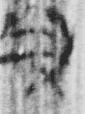凡
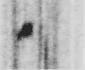人
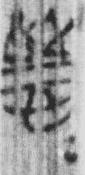偽
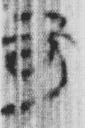可
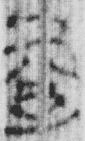亞（惡）
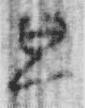也
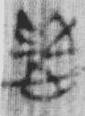○（偽）
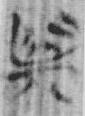斯B（斯）
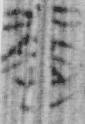○（矜）
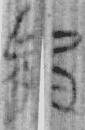矣
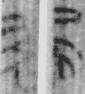○（矜）
